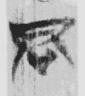君
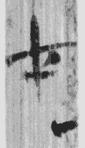才
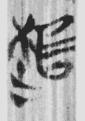𧻚
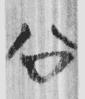公
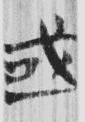或
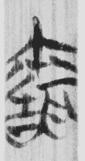{尒䎽}
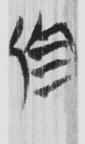於
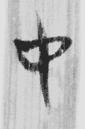中
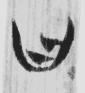曰
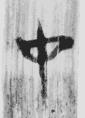中
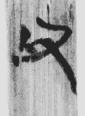父
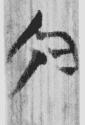今
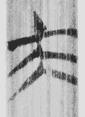夫
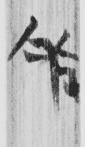年
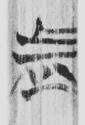者
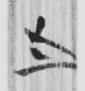之
